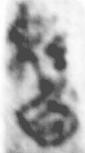○（縣）
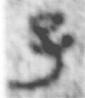子
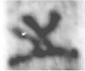之
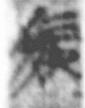駟
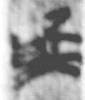爲
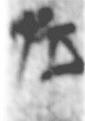○（左）
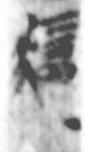驂
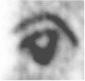司
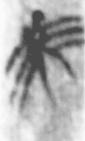馬
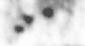之
